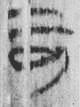可（何）
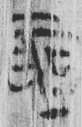聖（聽）
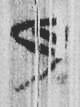月
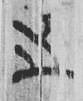之
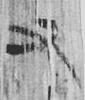又（有）
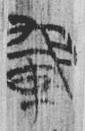軍
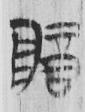𨟻（將）
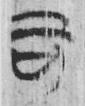可（何）
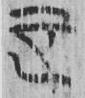正
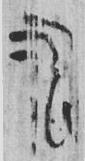水
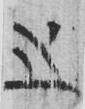之
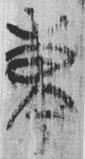東
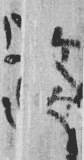流
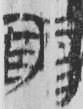𨟻（將）
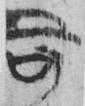可（何）
